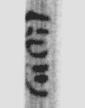智
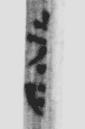者
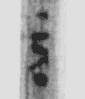不
